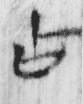占
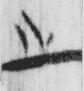之
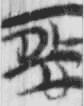恆
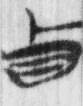貞
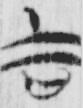吉
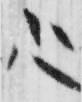少
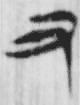又（有）
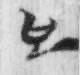也
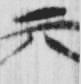亓
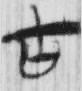古
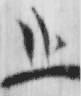之
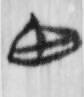甶（思）
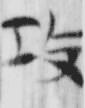攻
